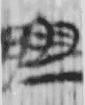瘳
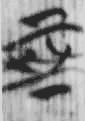亞
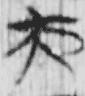夫
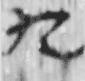九
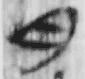月
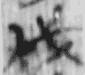戊
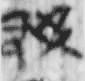○（鄢）
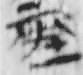坪
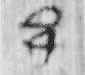邑
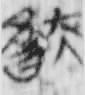○（胡）
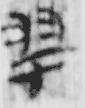○（羽）
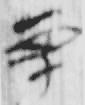辛
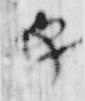丑
